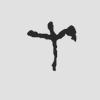又
